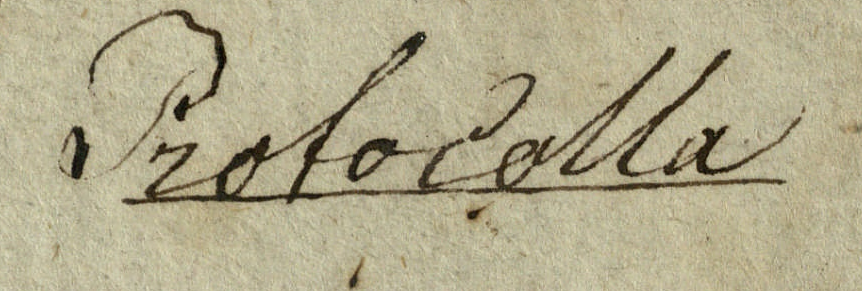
Protocolla
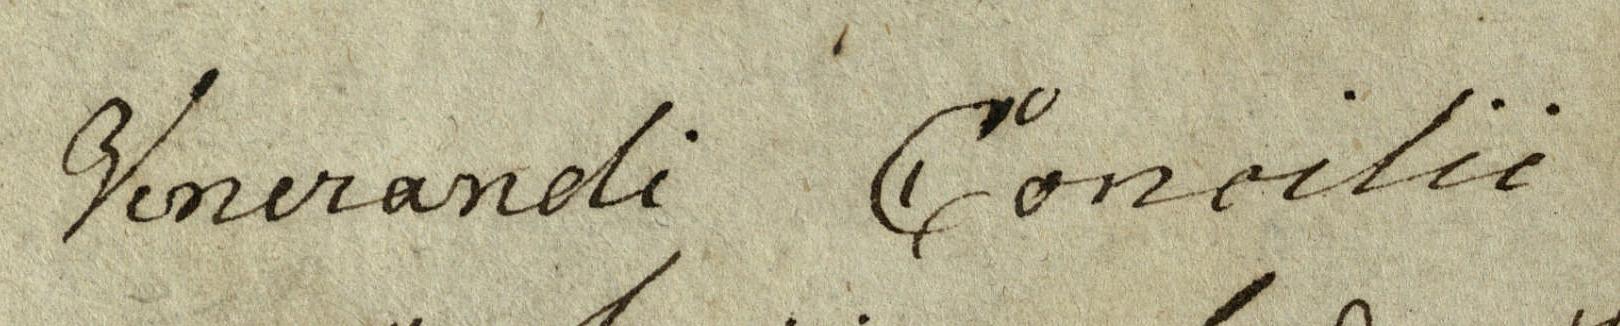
Venerandi Concilii
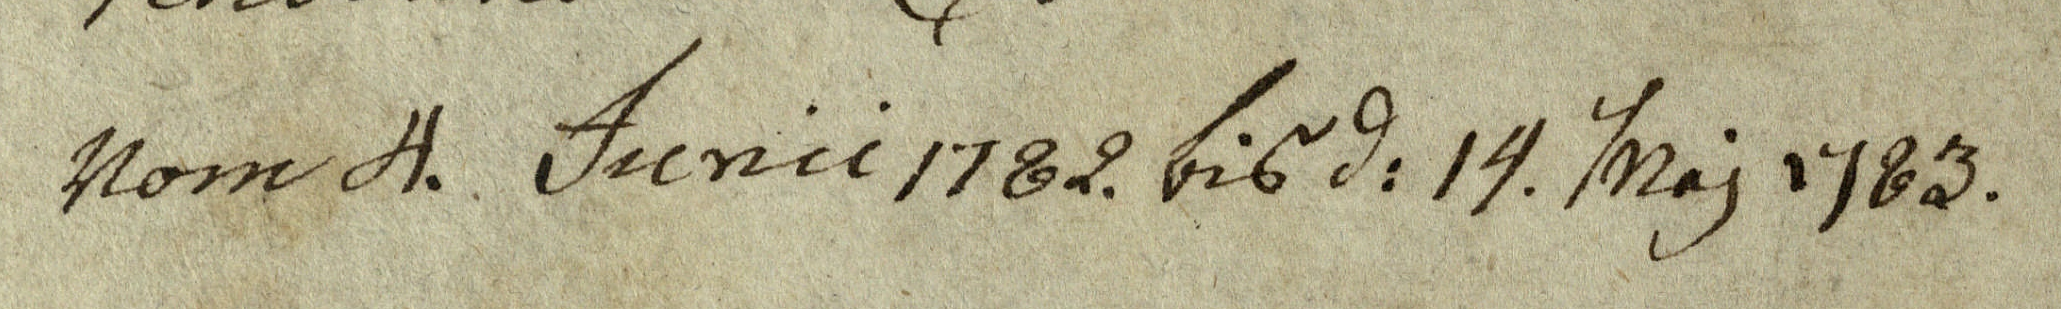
vom 4. Junii 1782. bis d 14. Maj 1783.
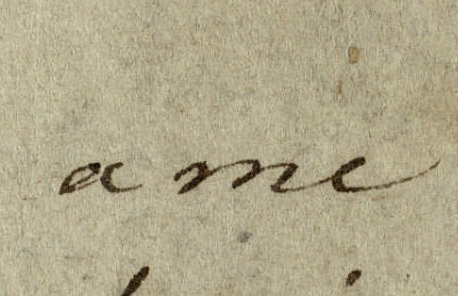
a me
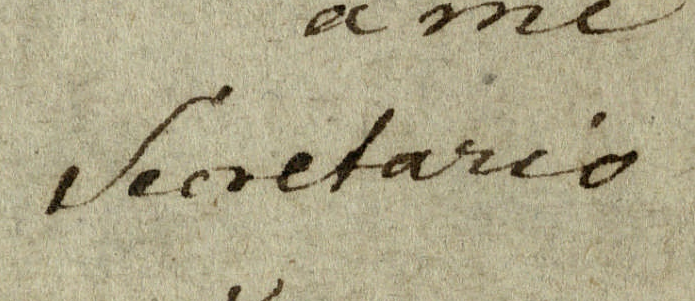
Secretario
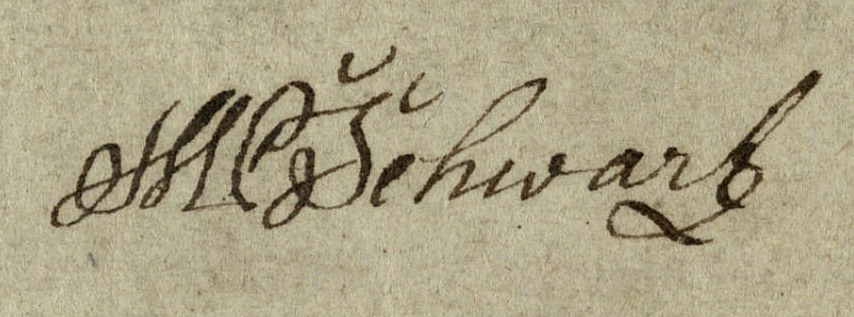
M C Schwartz
